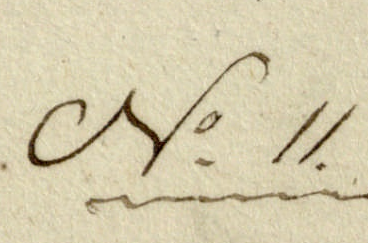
No 11.
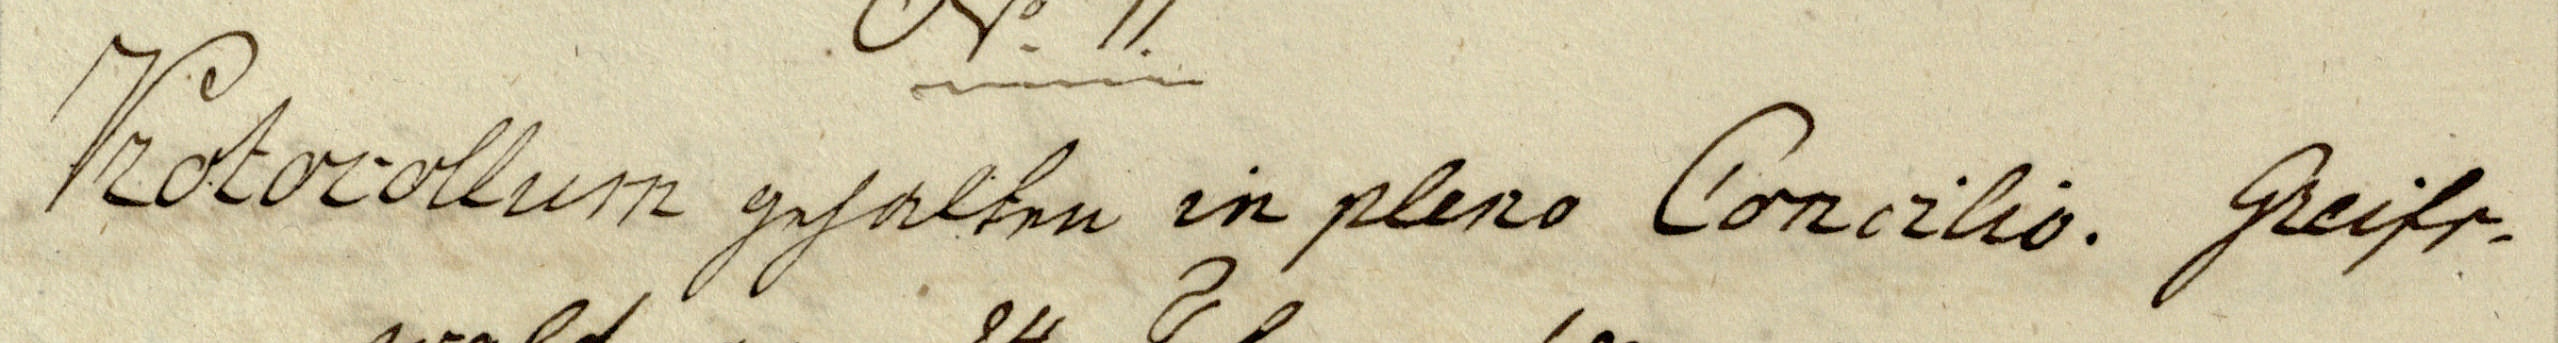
Protocollum gehalten in pleno Concilio. Greifs¬
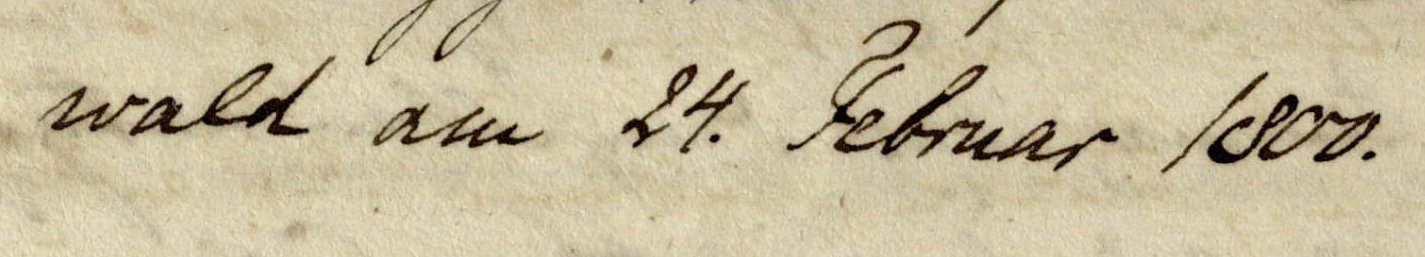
wald am 24. Februar 1800.
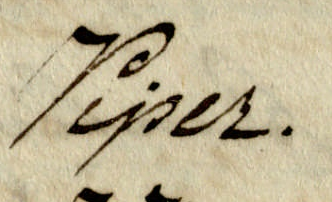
Piper.
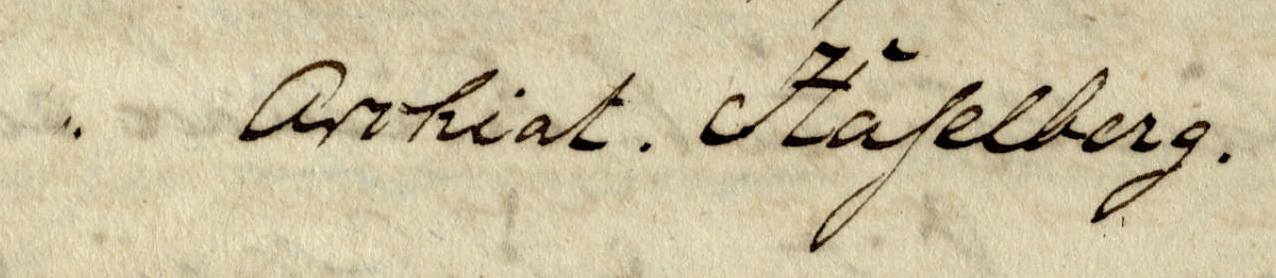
Archiat. Haselberg.
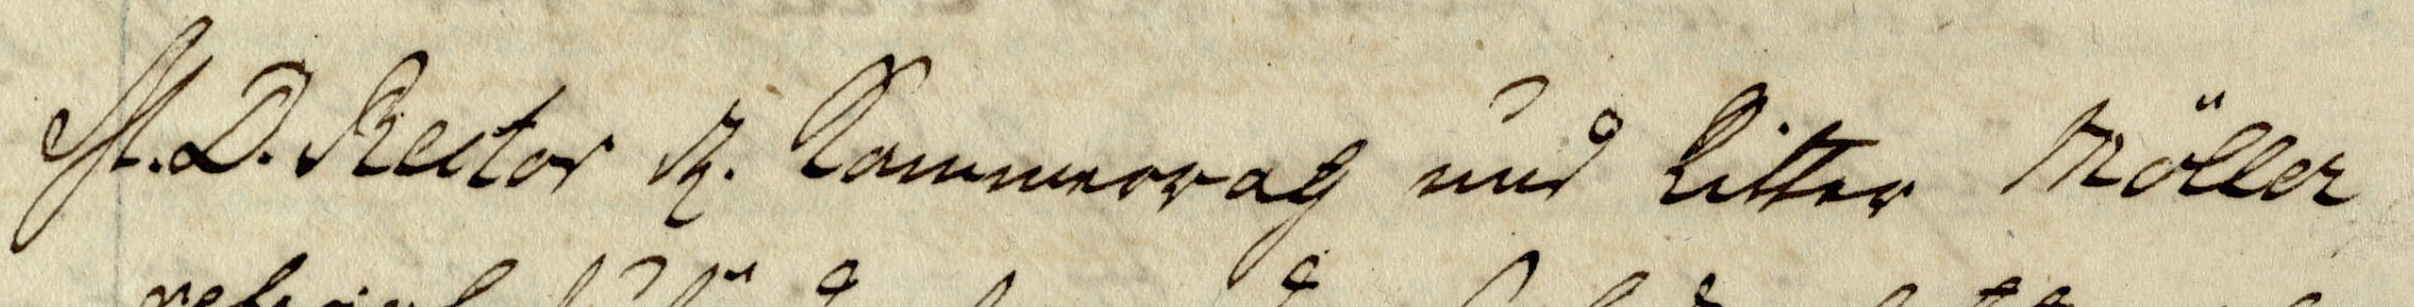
M D. Rector dh. Kammerrath und Ritter Möller
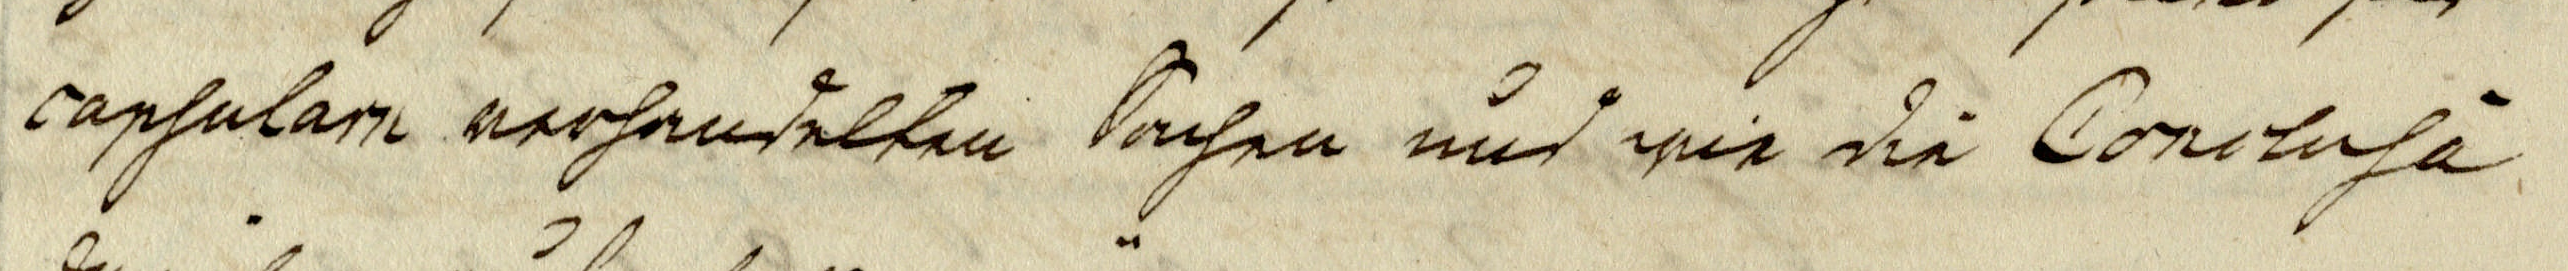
capsulam verhandelten Sachen und wie die Conclusa
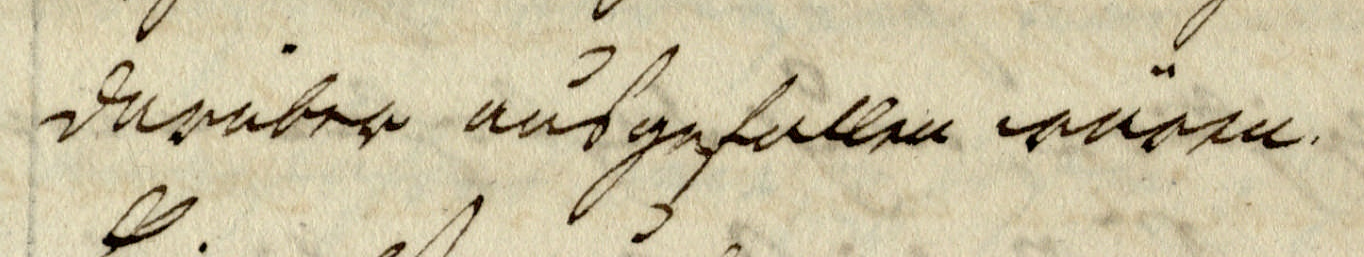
darüber ausgefallen wären.
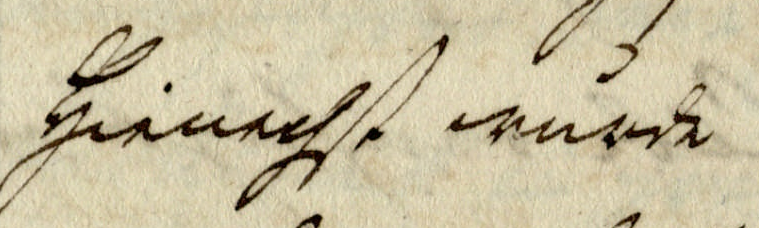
Hienechst wurde
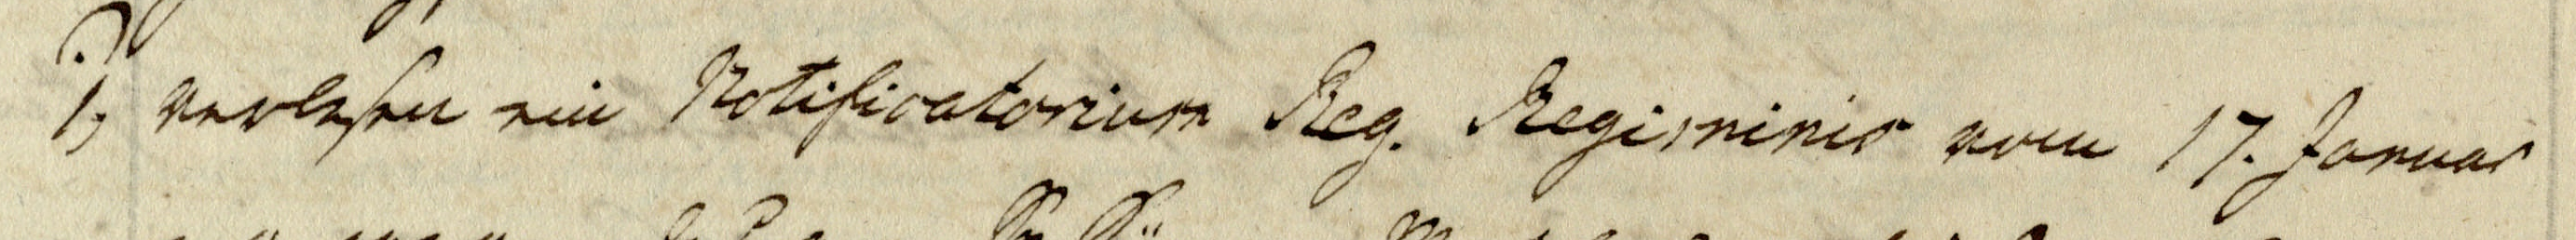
1. verlesen ein Notificatorium Reg. Regiminis vom 17. Januar
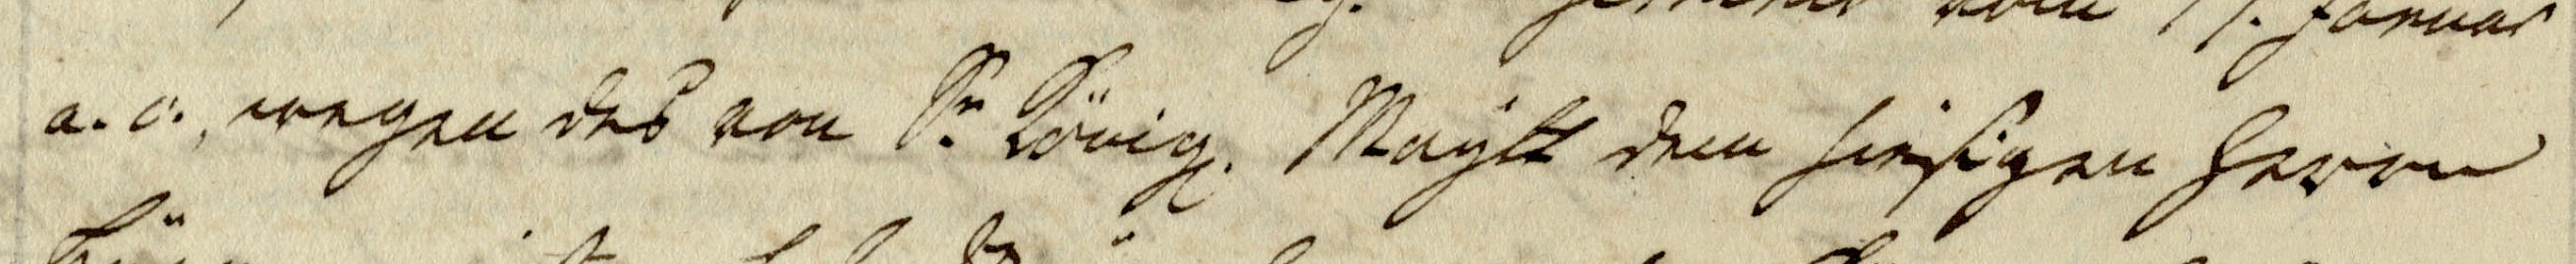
a. c., wegen des von Sr. Königl. Maÿtt dem hiesigen Herrn
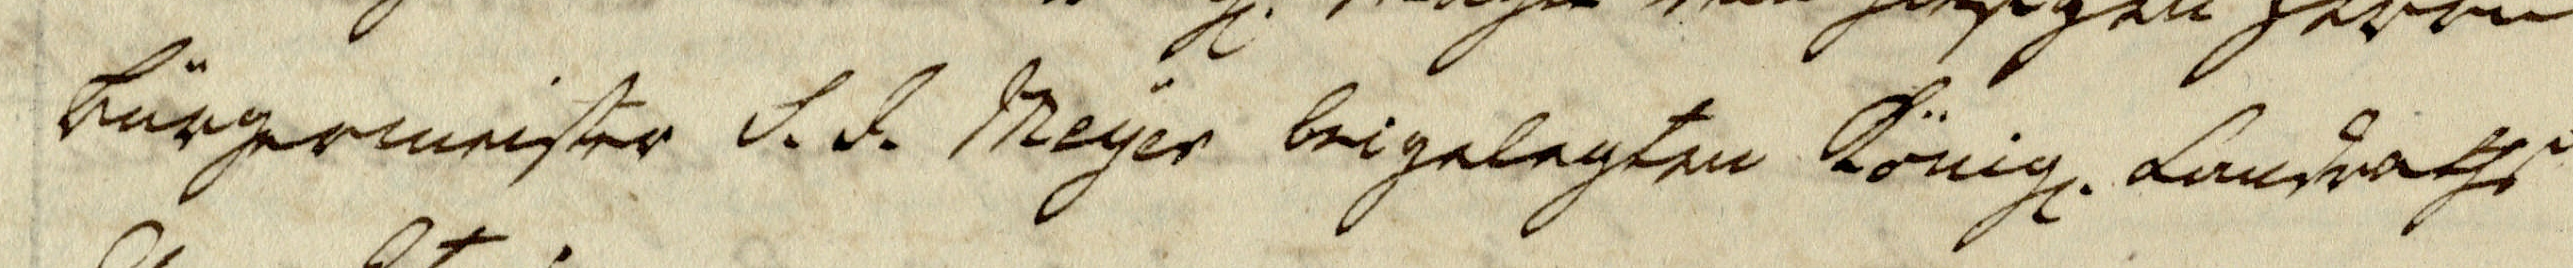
Bürgermeister S. I. Meÿer. beigelegten Königl. Landraths
